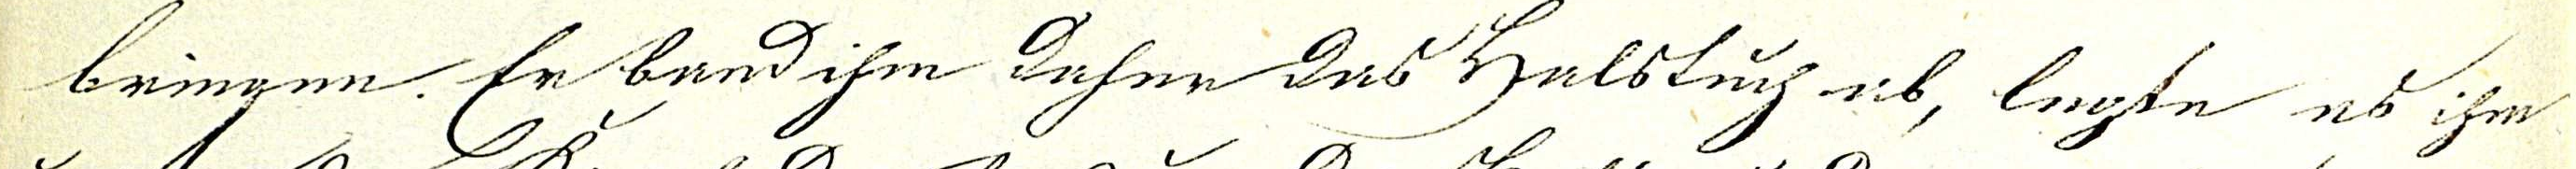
bringen. Er band ihm daher das Halstuch ab, legte es ihm
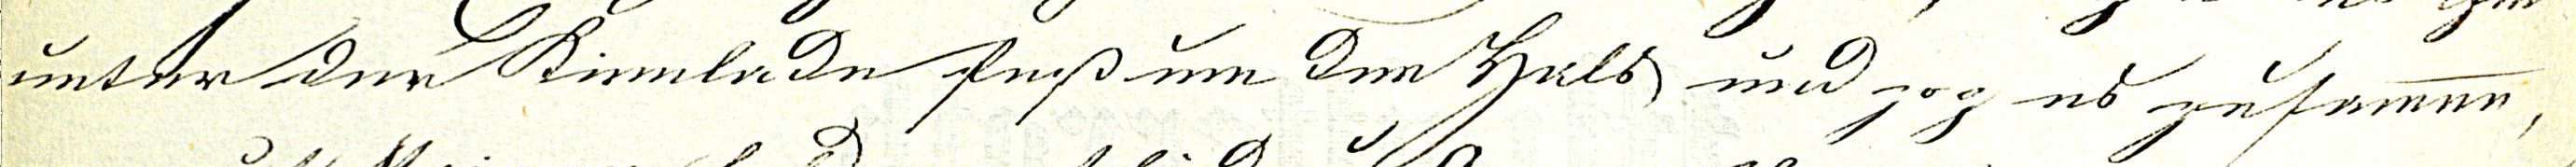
unter der Kinnlade fest um den Hals und zog es zusammen,
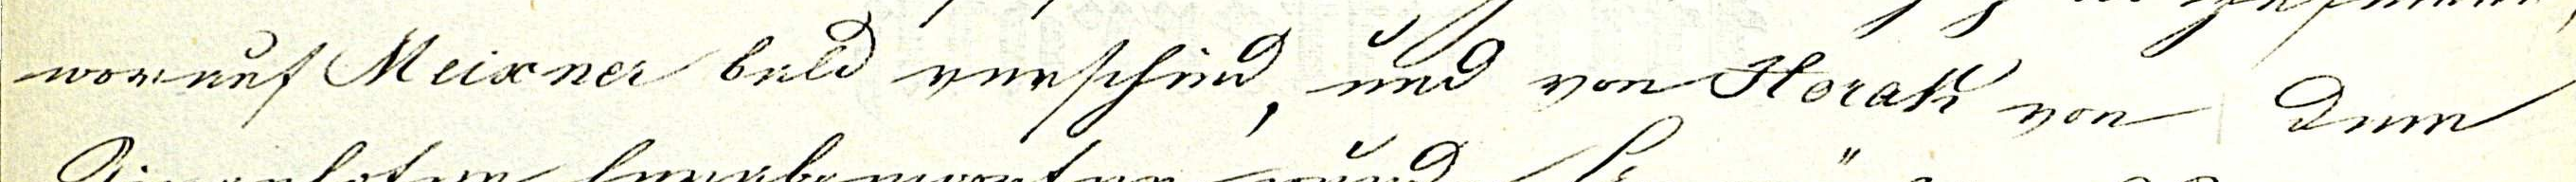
worauf Meixner bald verschied, und von Horak von dem
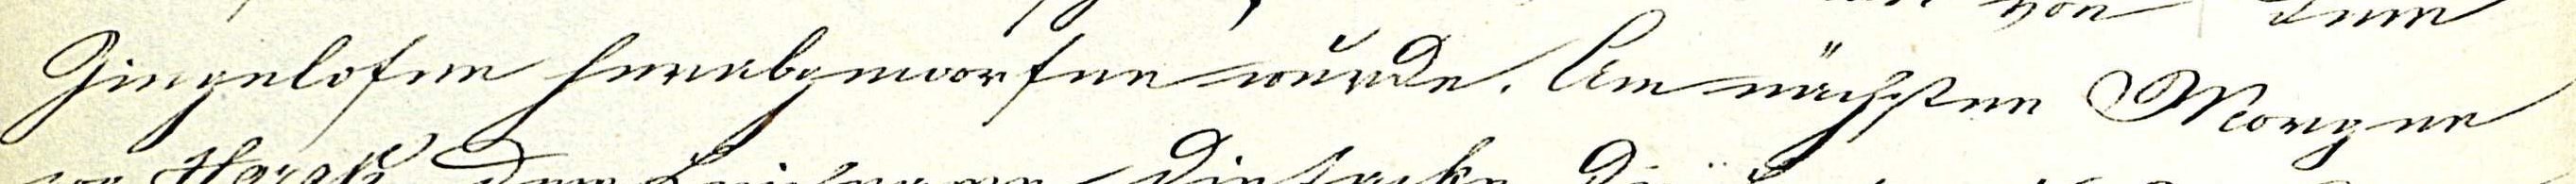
Ziegelofen herabgeworfen wurde. Am nächsten Morgen
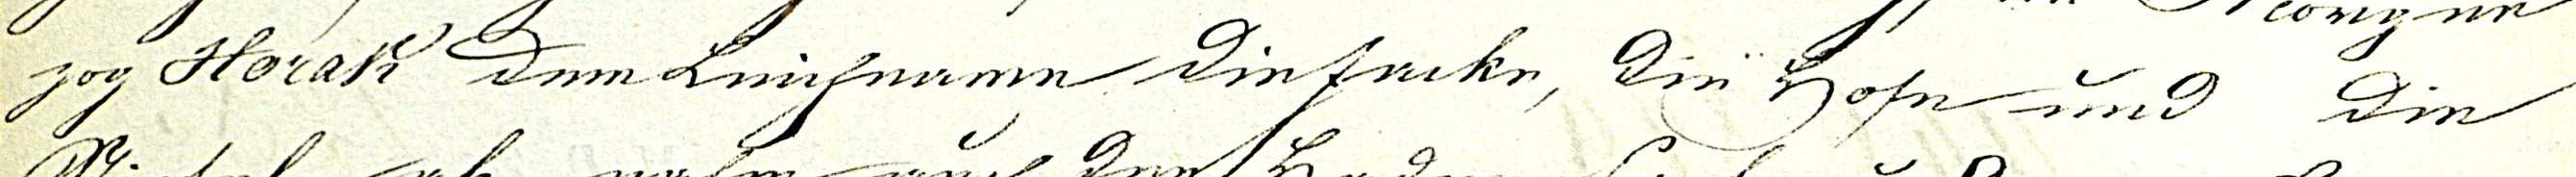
zog Horak dem Leichnam die Jacke, die Hose und die
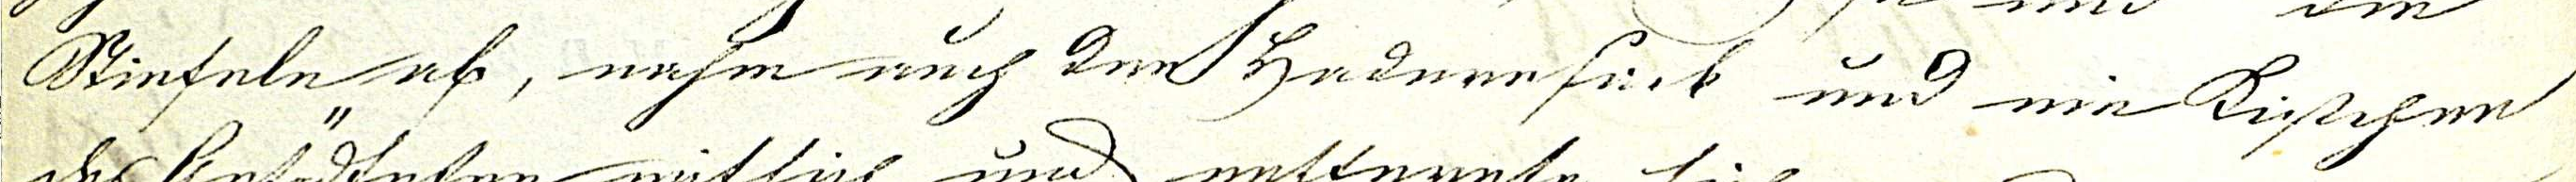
Stiefeln ab, nahm auch den Hadernsack und ein Kistchen
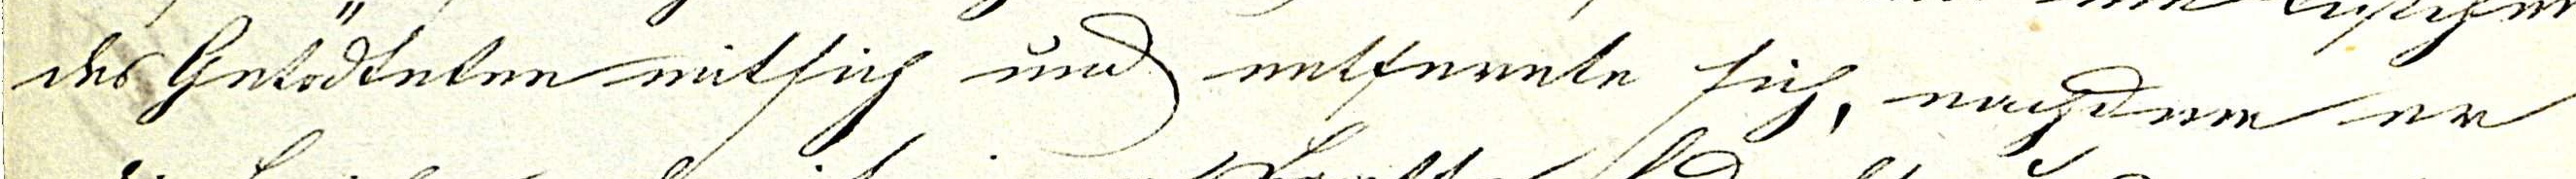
des Getödteten mit sich und entfernte sich, nachdem er
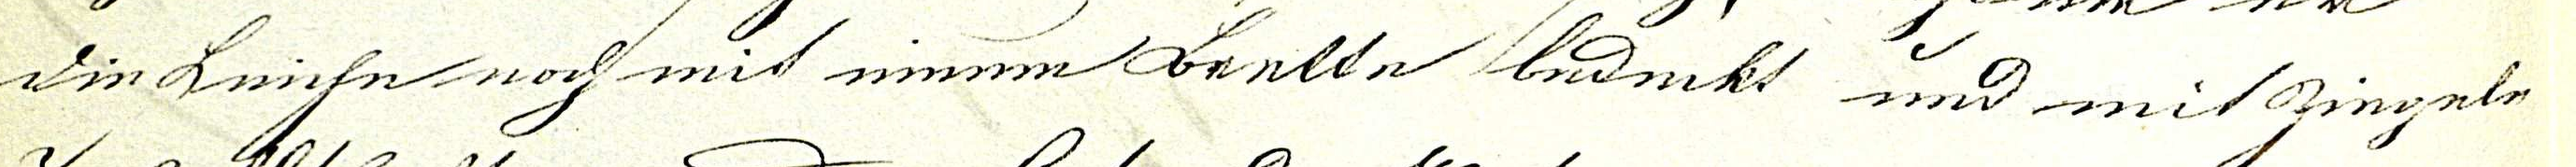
die Leiche noch mit einem Brette bedeckt und mit Ziegeln
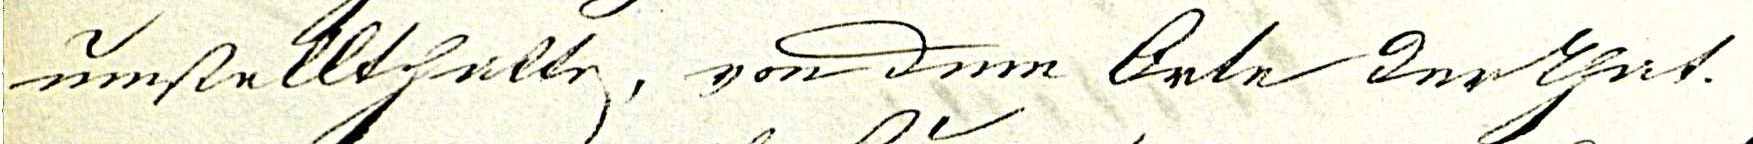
umstellt hatte, von dem Orte der That.
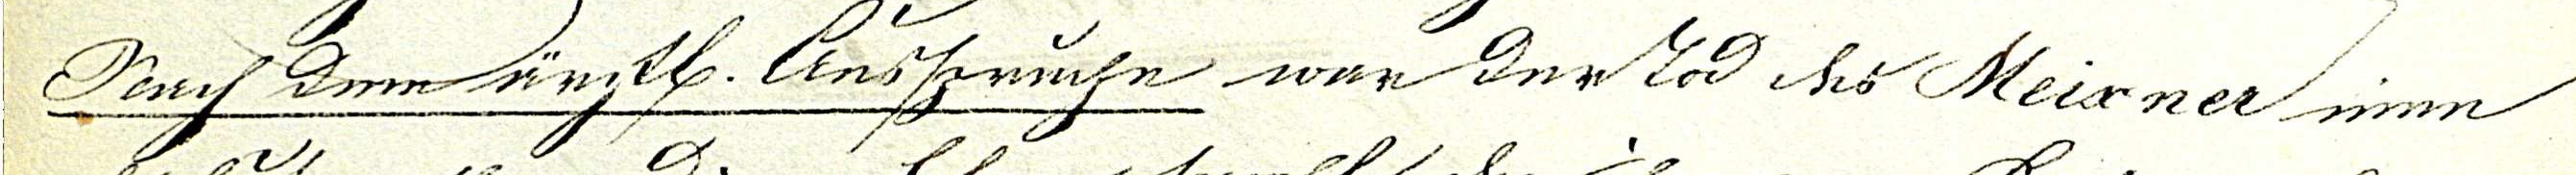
Nach dem ärztl. Ausspruche war der Tode des Meixner eine
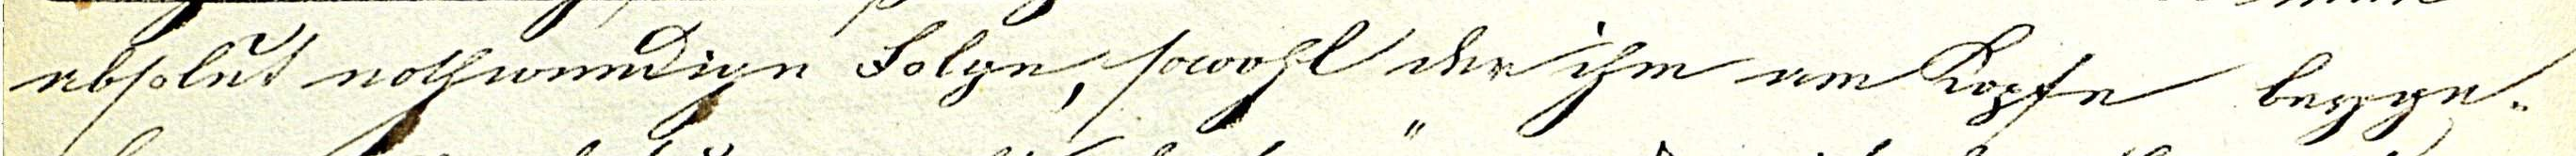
absolut nothwendige Folge, sowohl der ihm am Kopfe beige¬
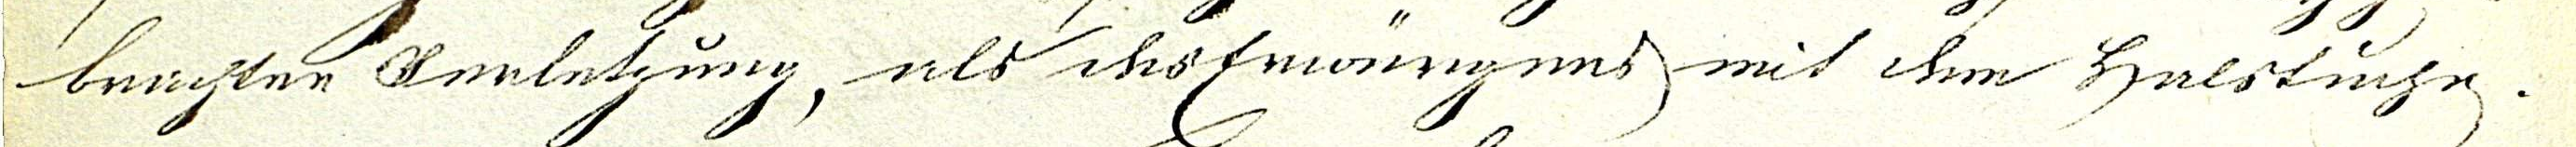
brachten Verletzung, als des Erwürgens mit dem Halstuche.
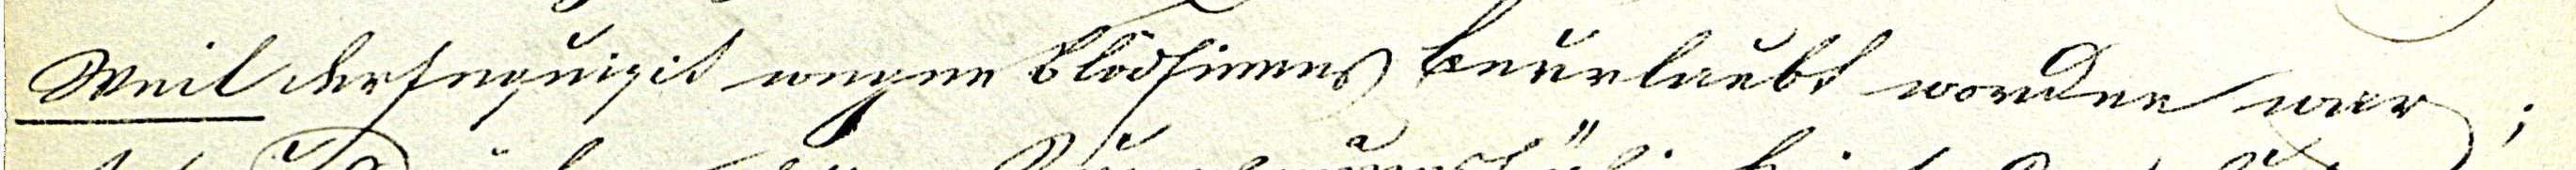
Weil der Inquisit wegen Blödsinnes beurlaubt worden war;
